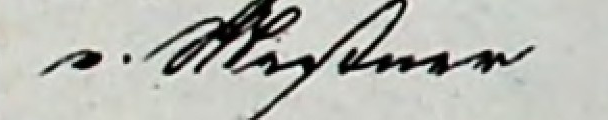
v. Meßner
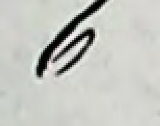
6
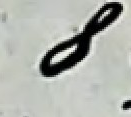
8
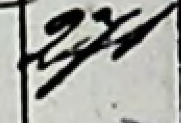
271
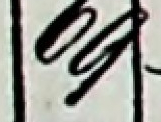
69
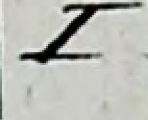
I
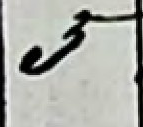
5
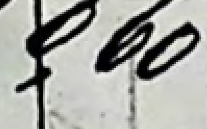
0,60
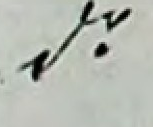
do
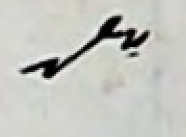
do
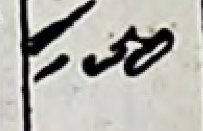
1,50
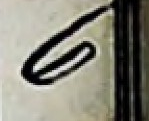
6
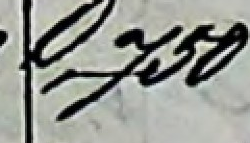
0,750
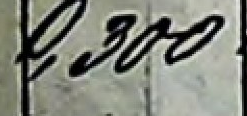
0,300
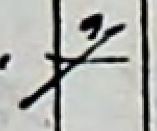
7
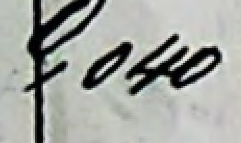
0,040
